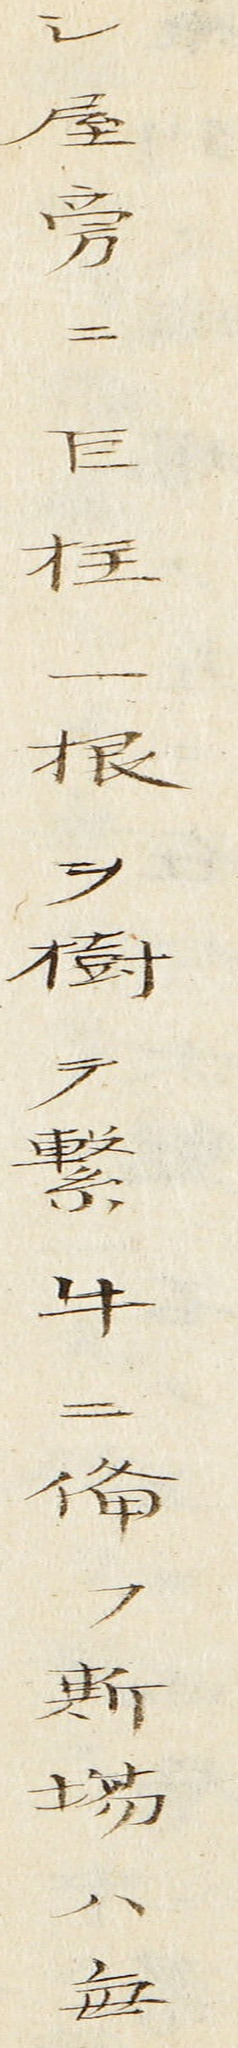シ屋旁ニ巨柱一根ヲ樹テ繋牛ニ備フ斯場ハ毎
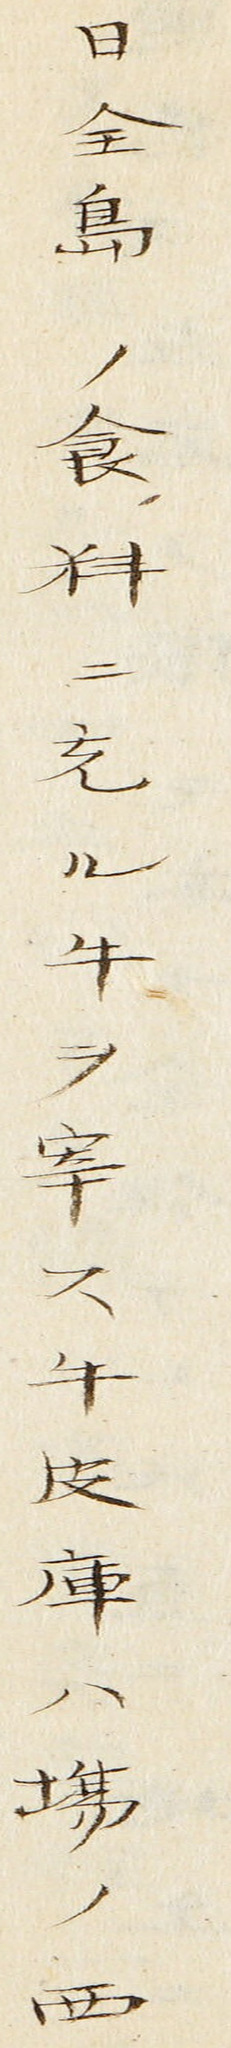日全島ノ食料ニ充ル牛ヲ宰ス牛皮庫ハ場ノ西
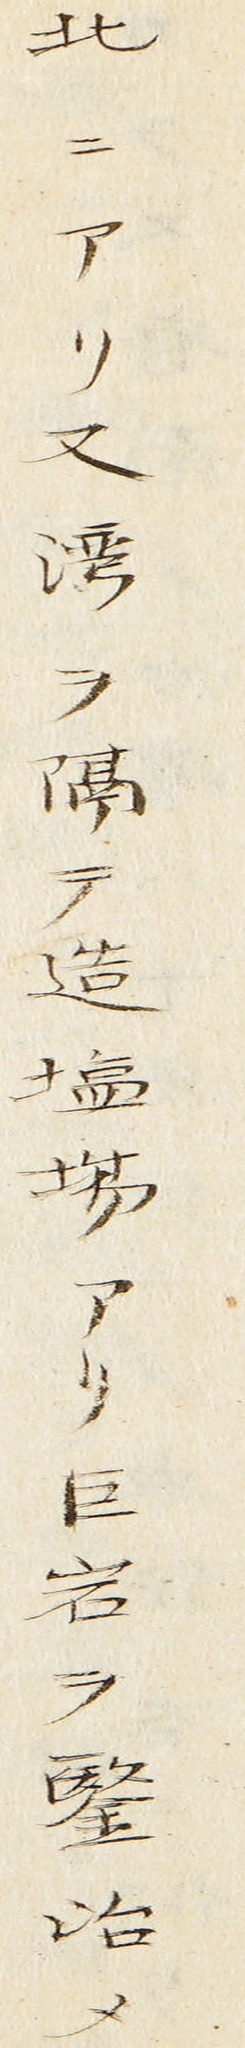北ニアリ又湾ヲ隔テ造塩場アリ巨岩ヲ鋻治シテ
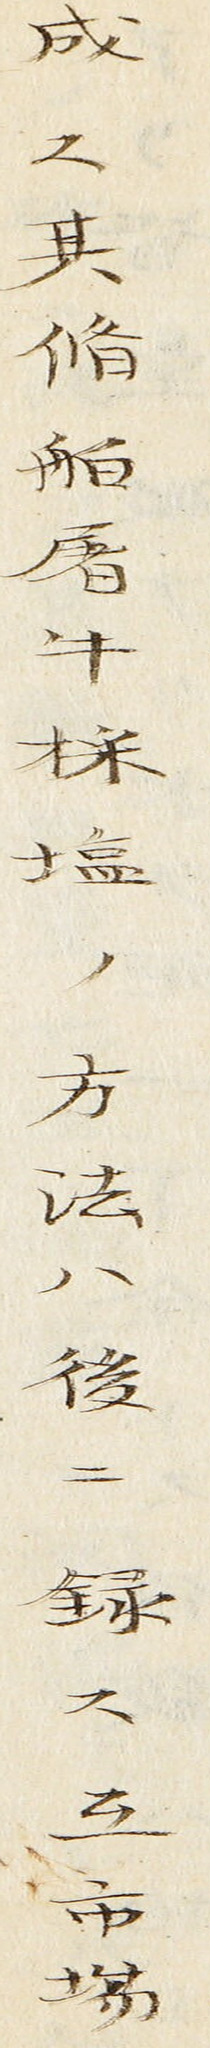成ス其修舶屠牛採塩ノ方法ハ後ニ録ス互市場
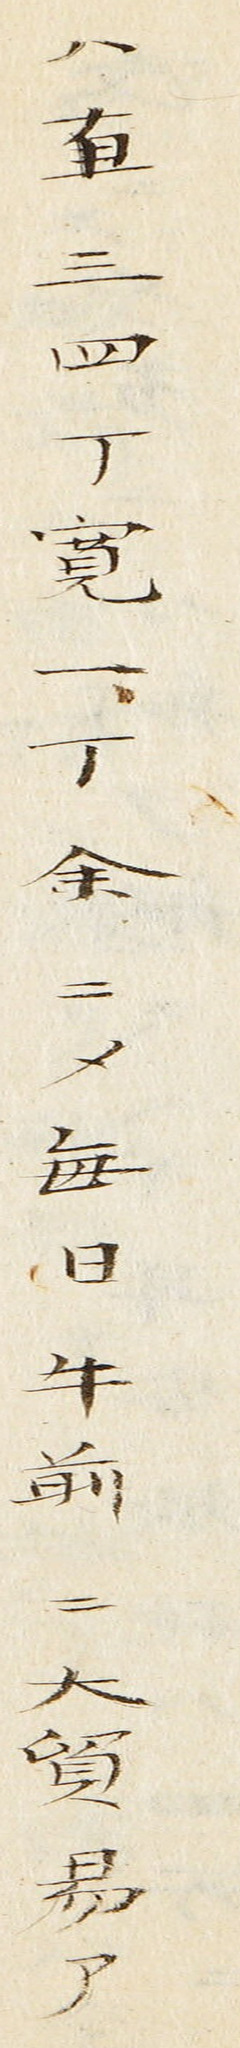ハ直三四丁寛一丁余ニシテ毎日午前ニ大貿易ア
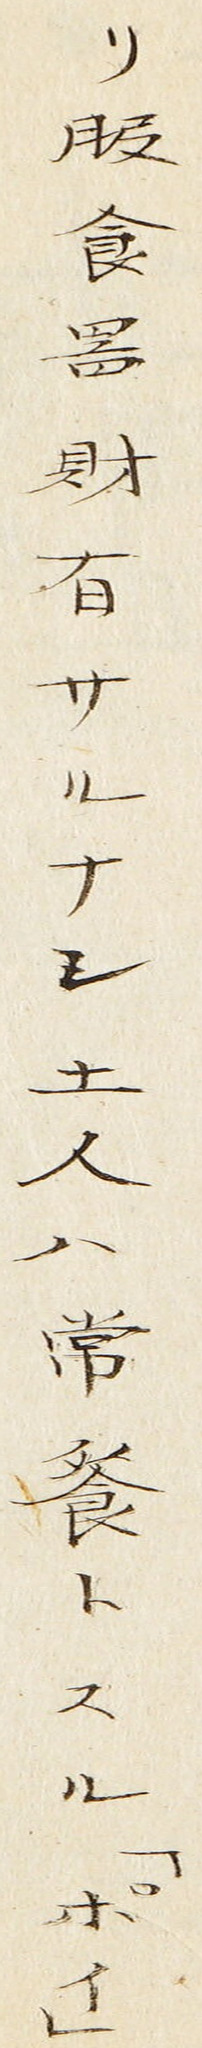リ服食器財有サルナシ土人ハ常餐トスル「ポイ」
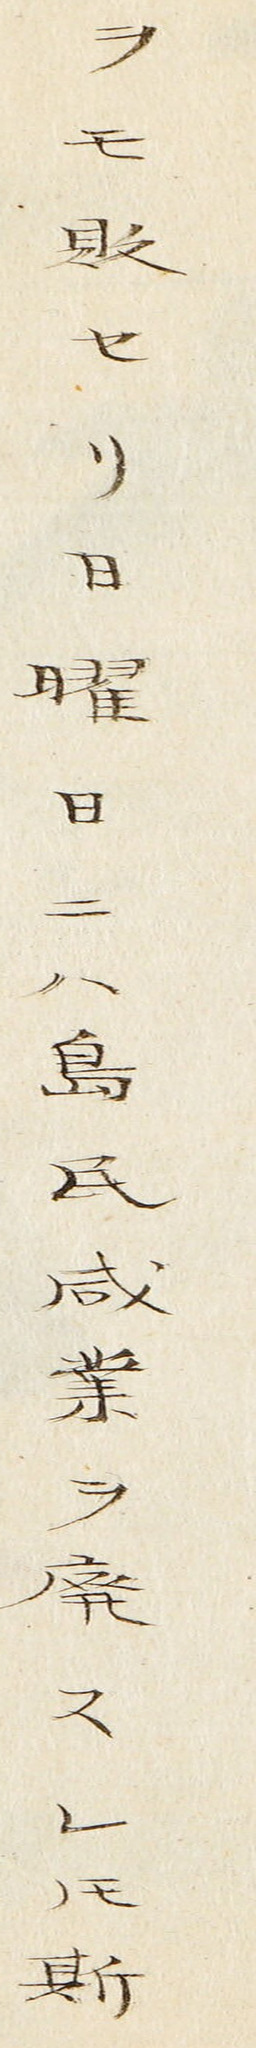ヲモ販セリ日曜日ニハ島民咸業ヲ廃スレトモ斯
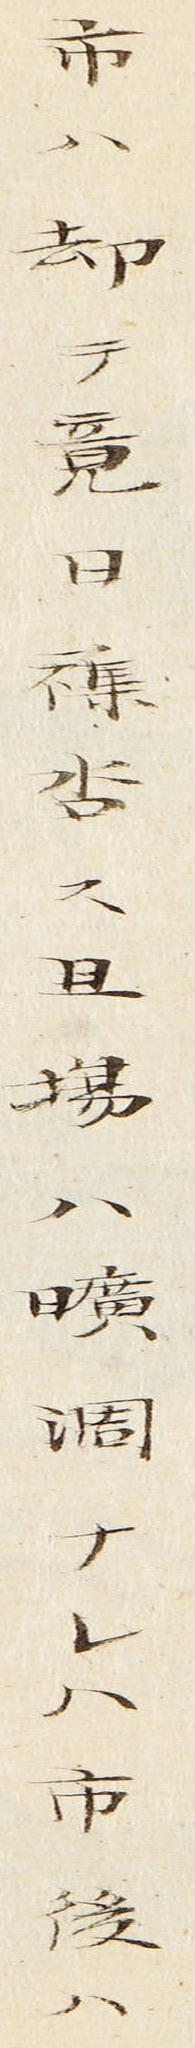市ハ却テ竟日襍呇ス旦場ハ曠淍ナレハ市後ハ
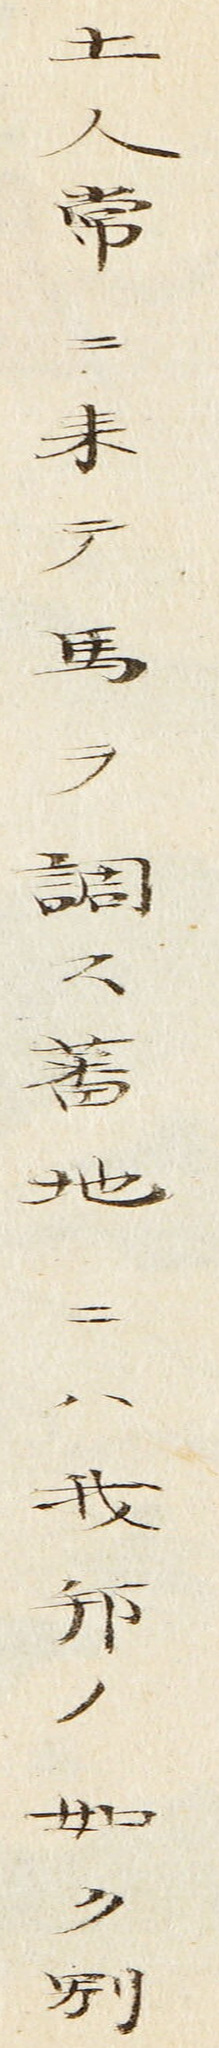土人常ニ来テ馬ヲ調ス蕃地ニハ我邦ノ如ク別
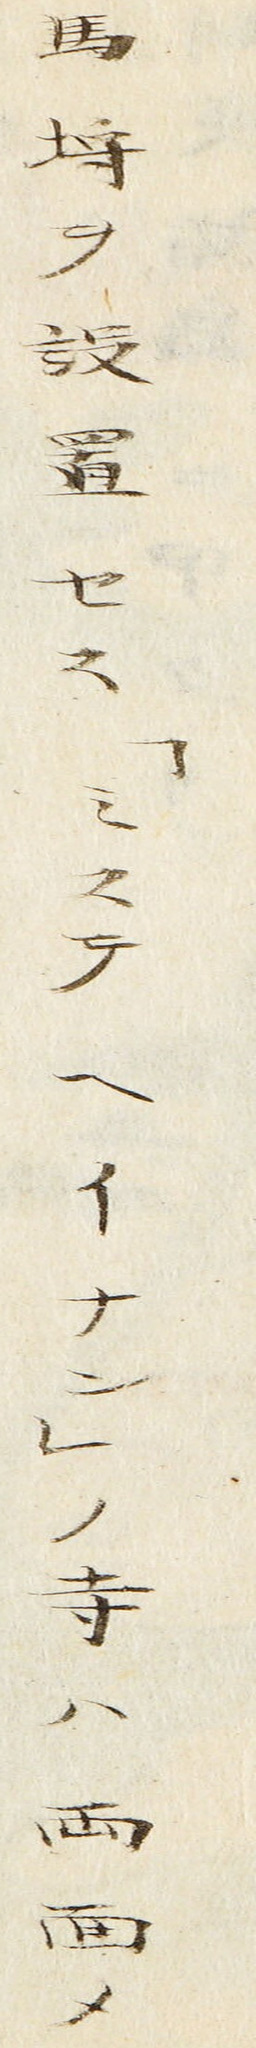馬垨ヲ設置セス「ミステヘイナン」ノ寺ハ両面シテ
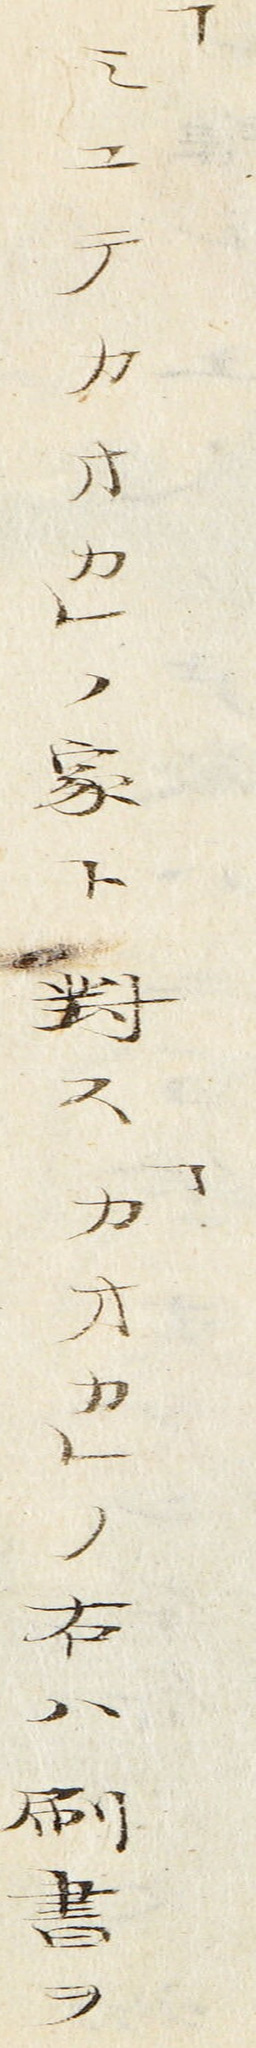「ミユテカオカ」ノ家ト対ス「カオカ」ノ右ハ刷書ヲ
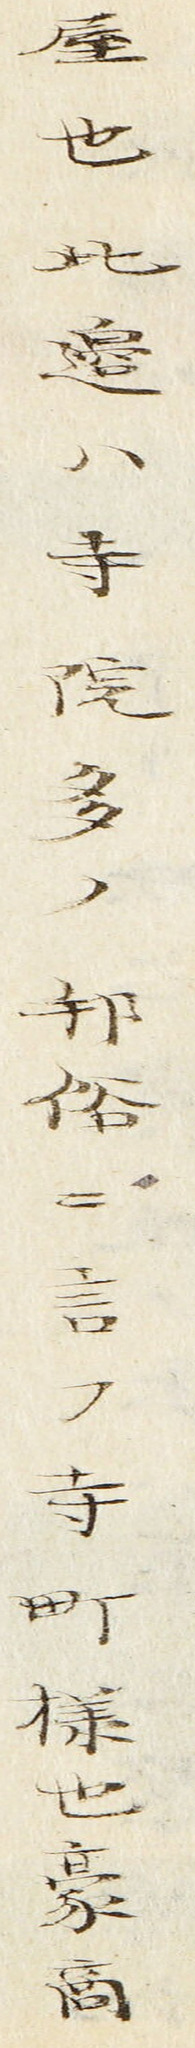屋也此辺ハ寺院多ノ邦俗ニ言フ寺町様也豪商
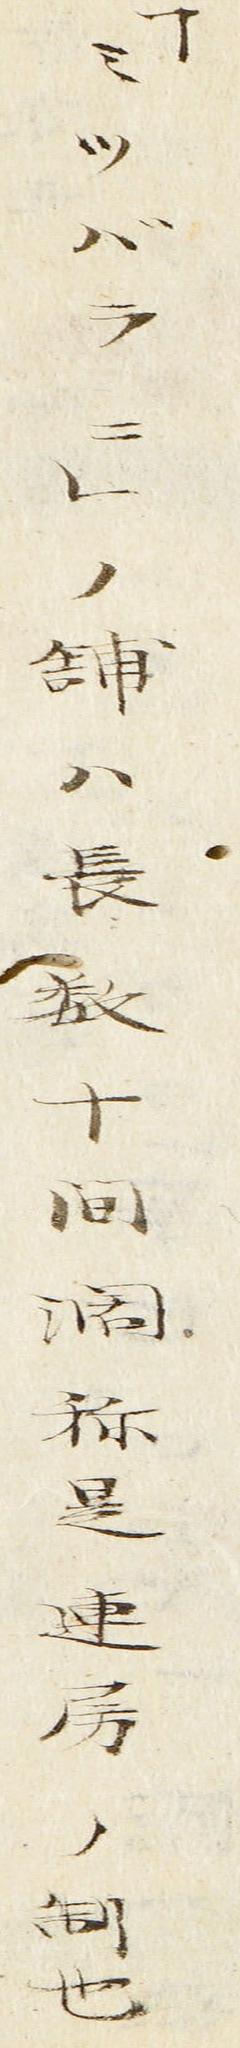「ミツバラニ」ノ舗ハ長数十間濶称是連房ノ制也
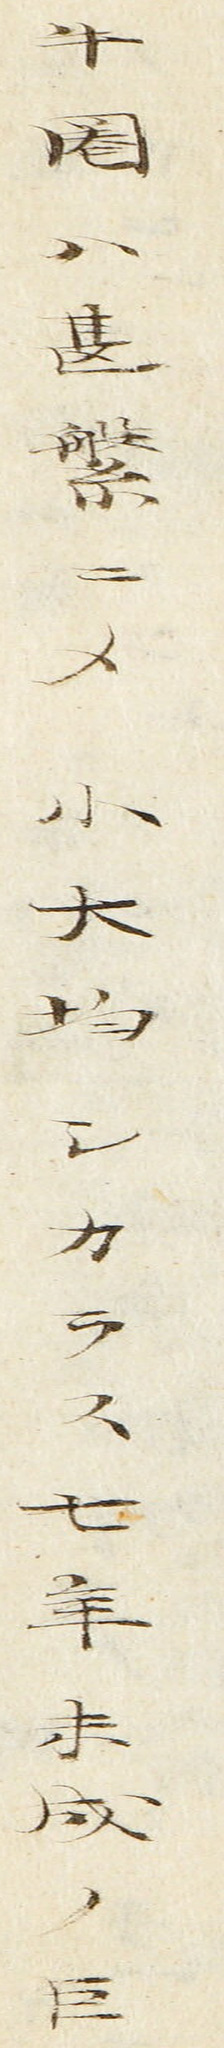牛圏ハ甚ニシテ小大均シカラス七年未成ノ巨
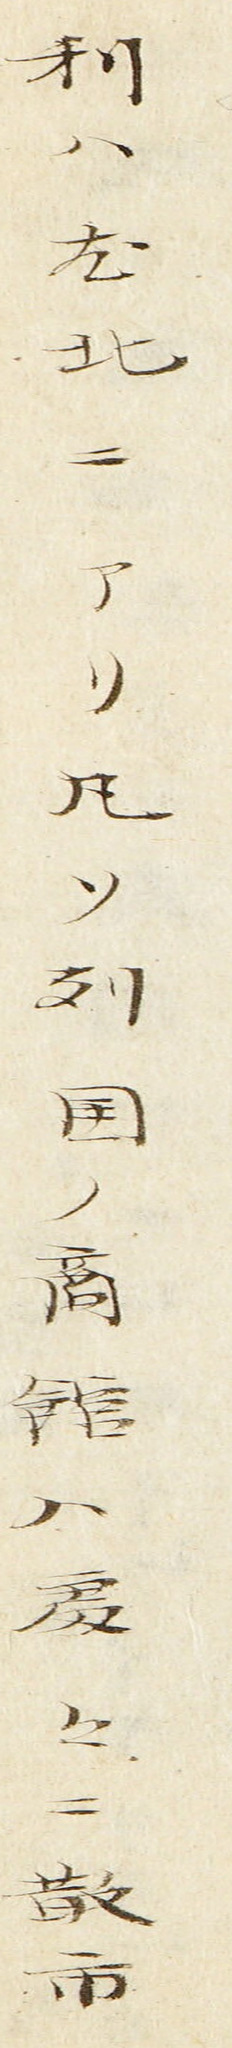利ハ尤北ニアリ凡ソ列国ノ商館ハ処々ニ散市

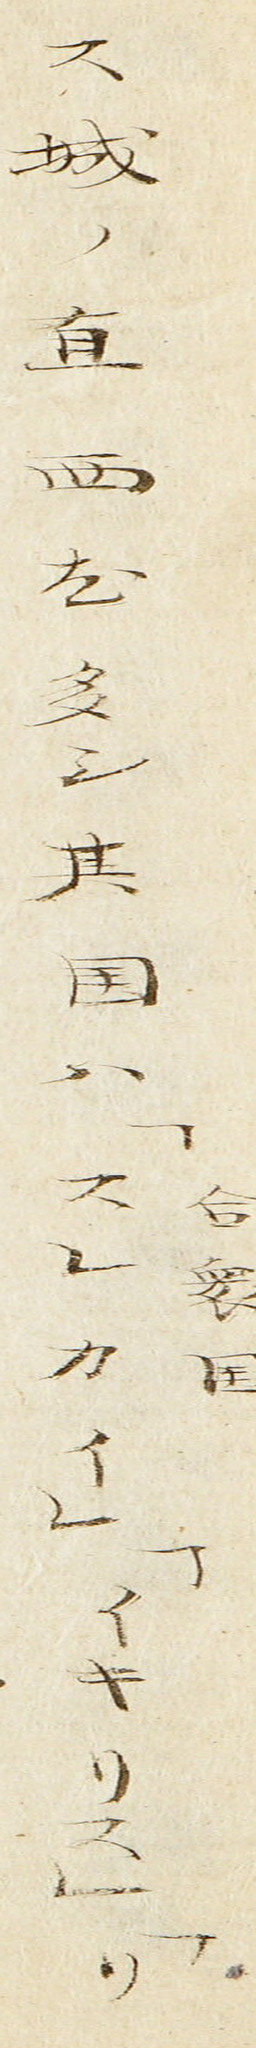ス城ノ直西尤多シ其国ハ「スレカイ」「イキリス」「リ
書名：流蕃通書
